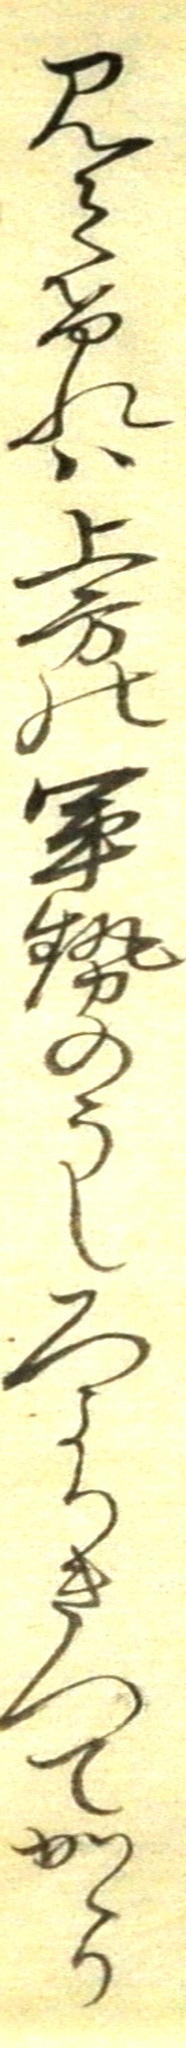見てけれは上方の軍勢のうしろよりきつてかゝり
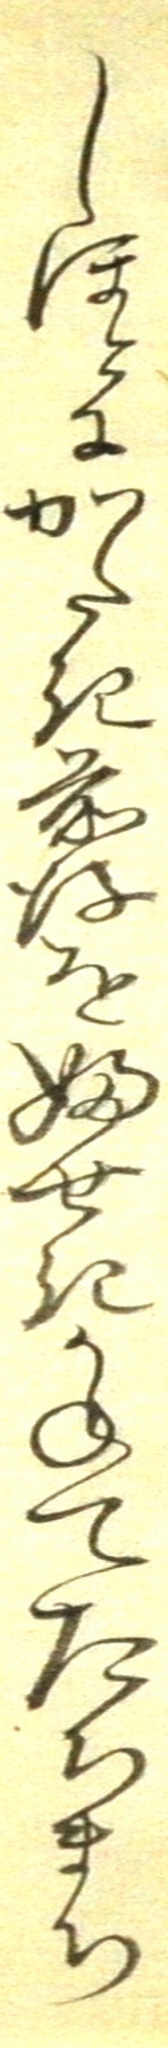しほとにかたき前後をふせきかねてたちまち
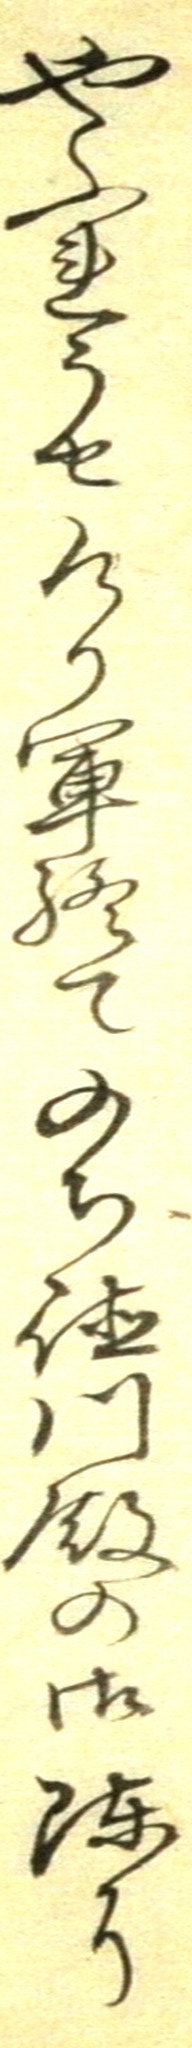やふれうせけり軍終てのち徳川殿の御陣に
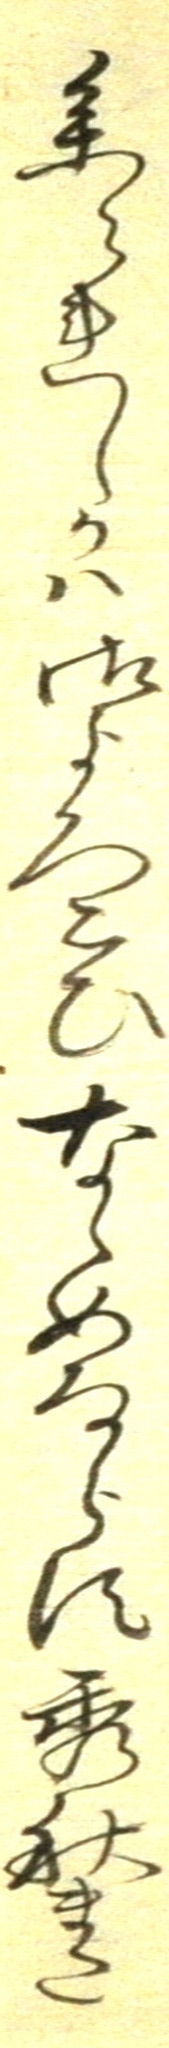参られしかは御よろこひなゝめならす秀秋また
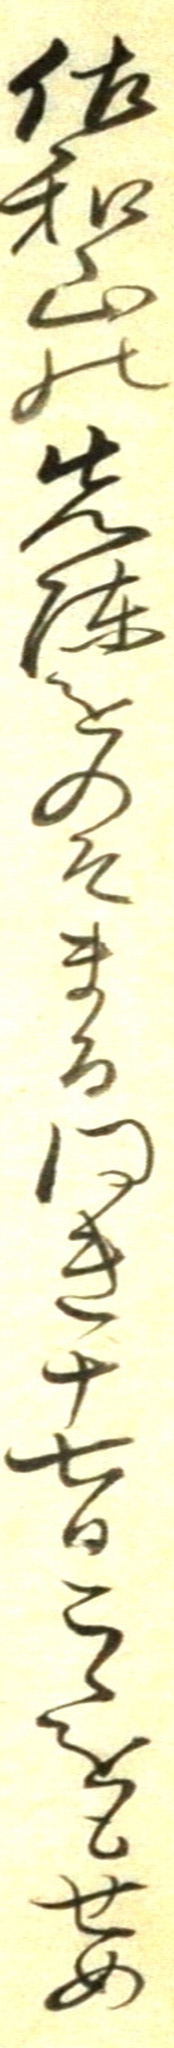佐和山の先陣をのそまる同き十七日こゝをもせめ
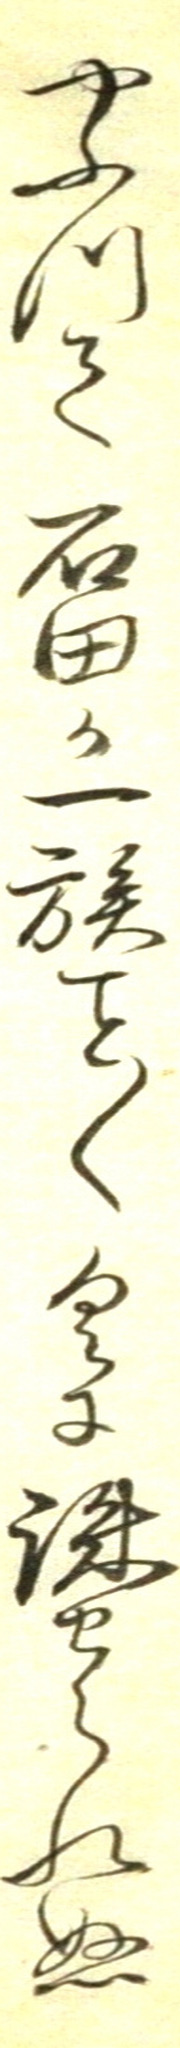やふつて石田か一族こと〳〵くに誅せられぬ
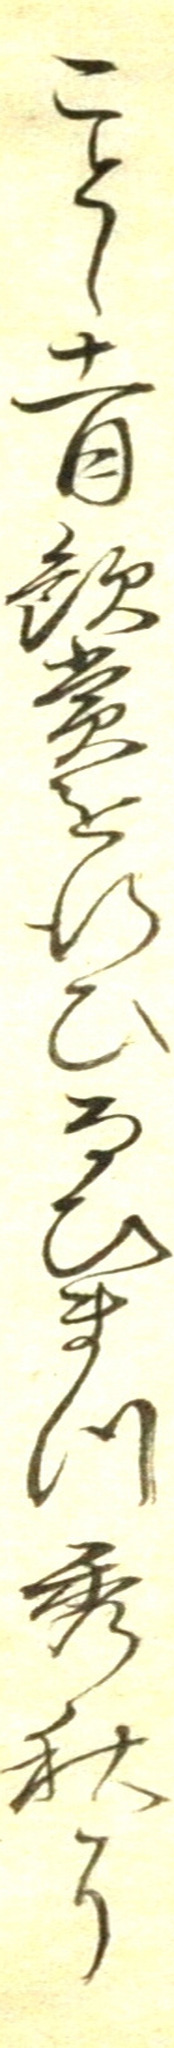ことし十一月勧賞を行ひなひまつ秀秋に
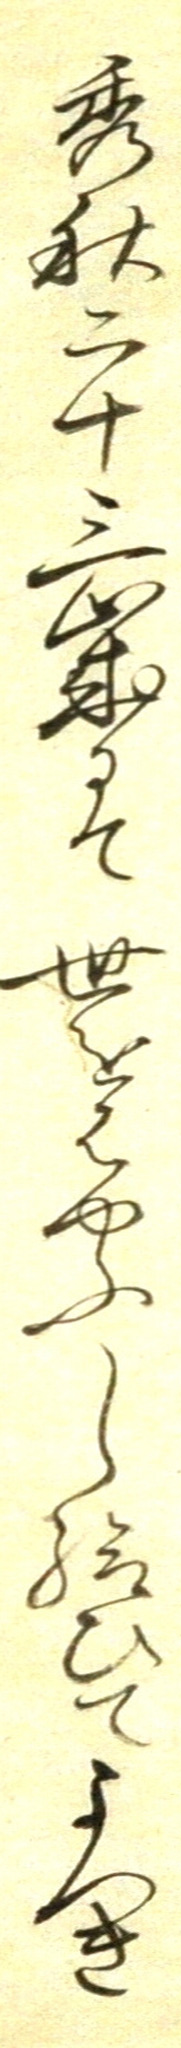秀秋二十三歳にて世をはやふし給ひてよつき
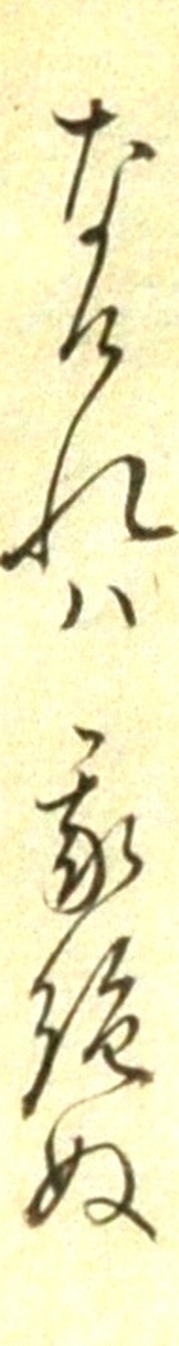なけれは家絶ぬ

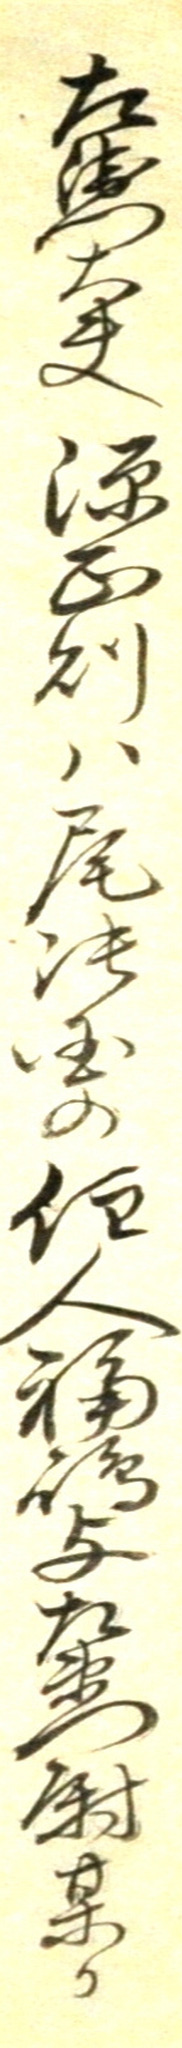左衛門大夫源正則は尾張国の住人福嶋与左衛門尉某か
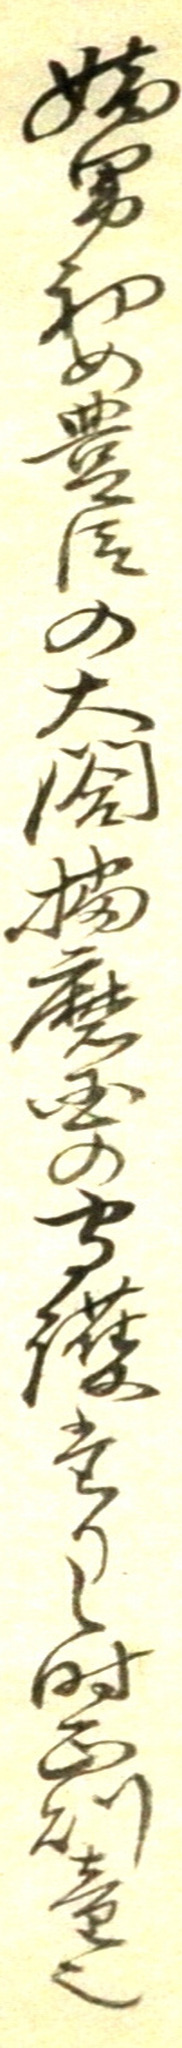嫡男初め豊臣の太閤播磨国の守護たりし時正則童也
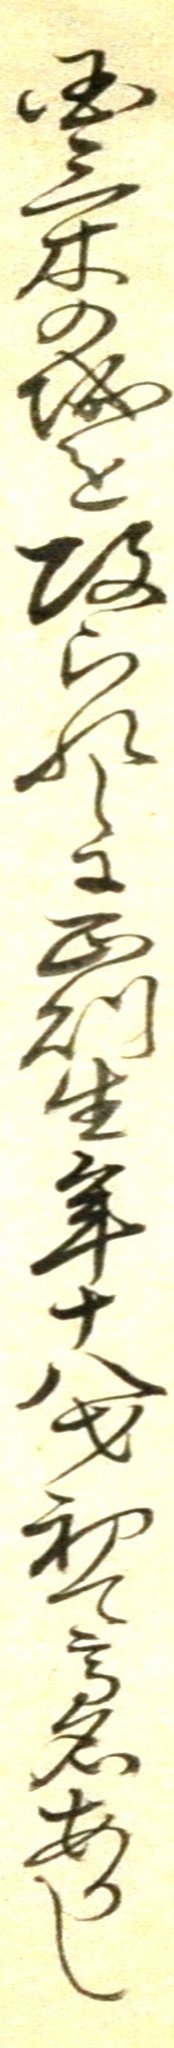国三木の城を攻られしに正則生年十八才初て高名ありし
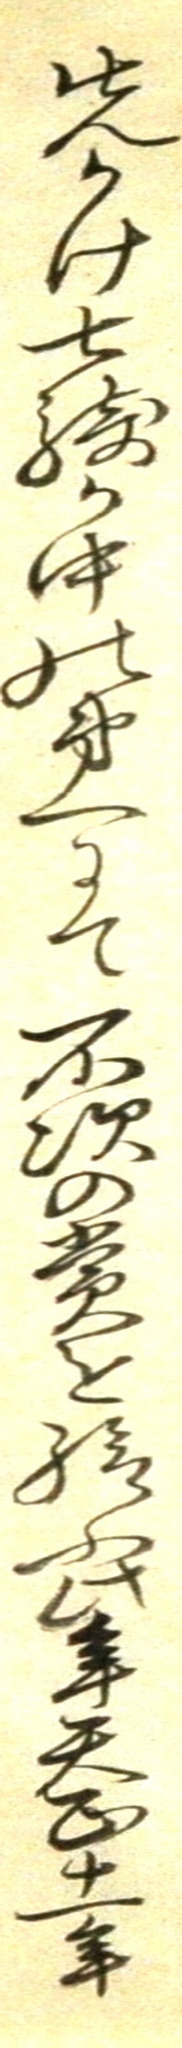先かけ七騎か七の第一にて不次の賞を給ふ此年天正十一年

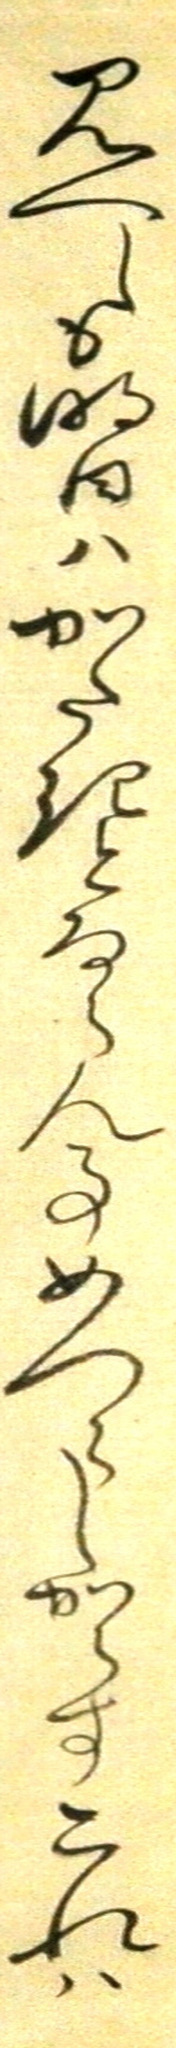見へしも明日はかたきとならん事めつｒめつらしからすこれは
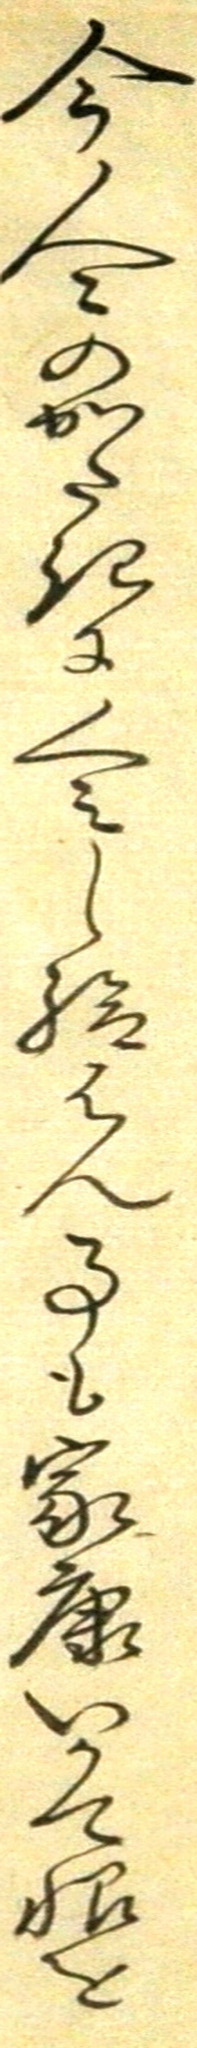今人々のかたきにくみし給ははん事も家康いかて恨を
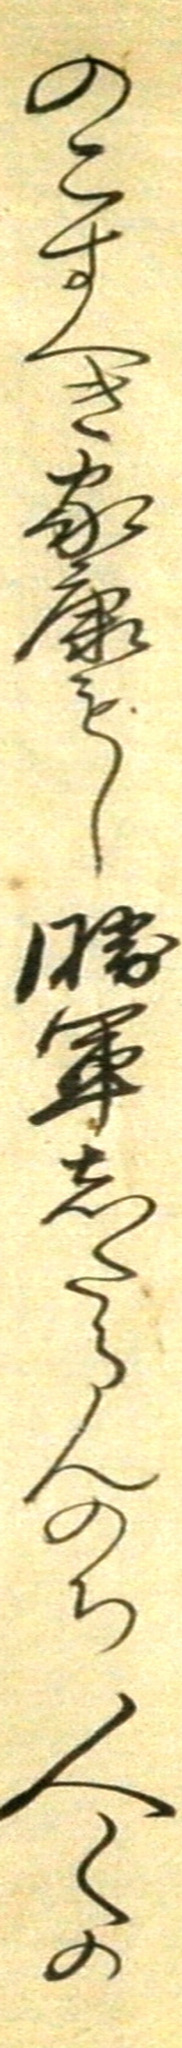のこすへき家康もし勝軍したらんのち人々の
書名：藩翰譜（十二・上）
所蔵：伊那市立高遠町図書館・合同会社AMANE
